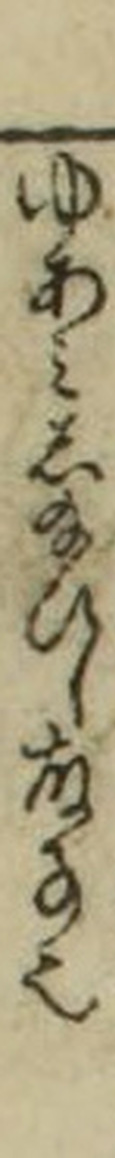ゆあみし給ひし故事也
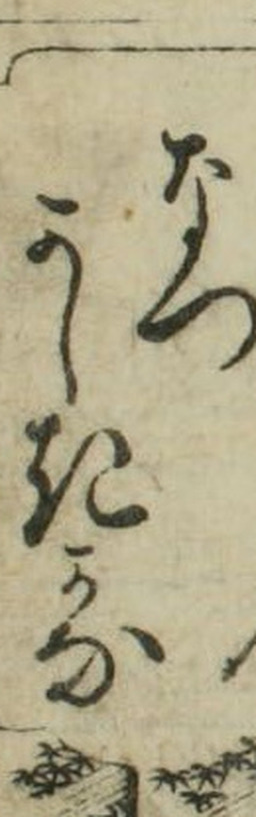かしきかな

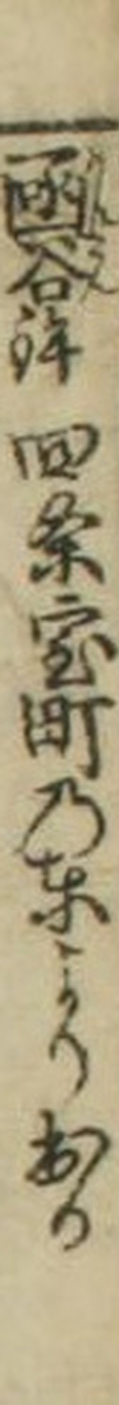函谷鉾四条室町の東より出る
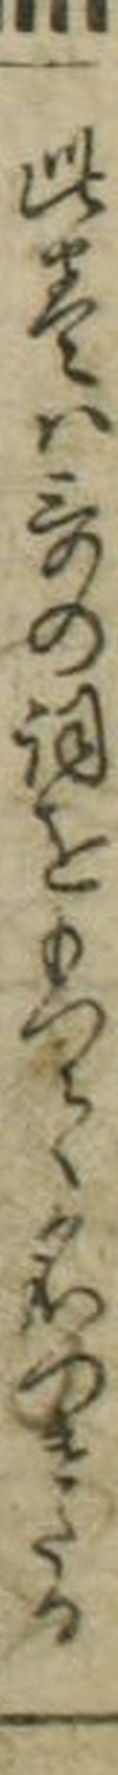此巻は哥の詞をもつて名つけたる
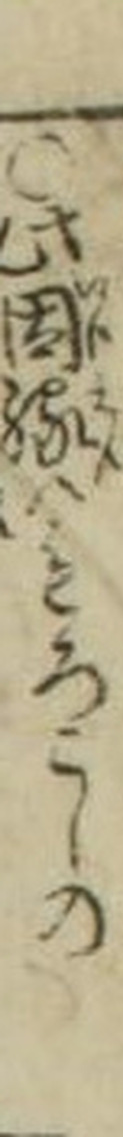〇此因縁はもろこしの
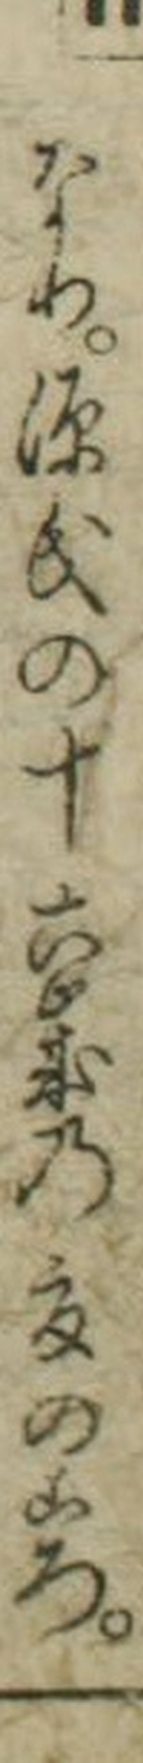なり。源氏十六歳の夏のころ。
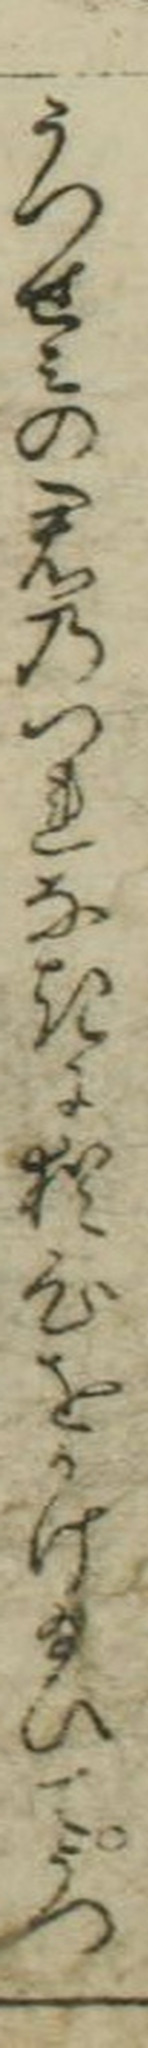うつせみの君のつれなきに猶心をかけ給ひて。うつ
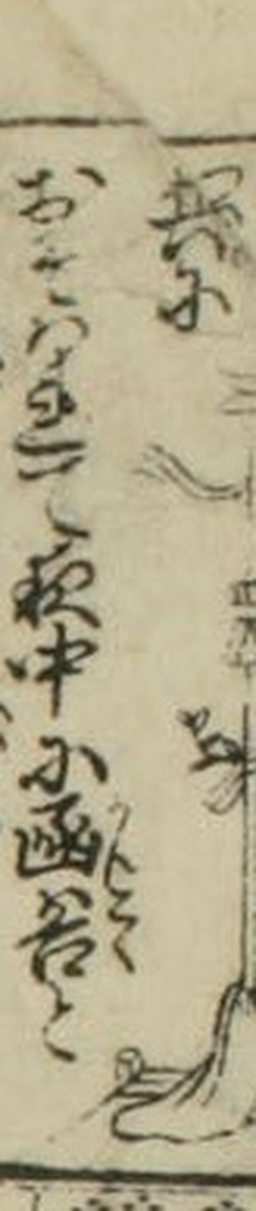おそはれて夜中に函谷と
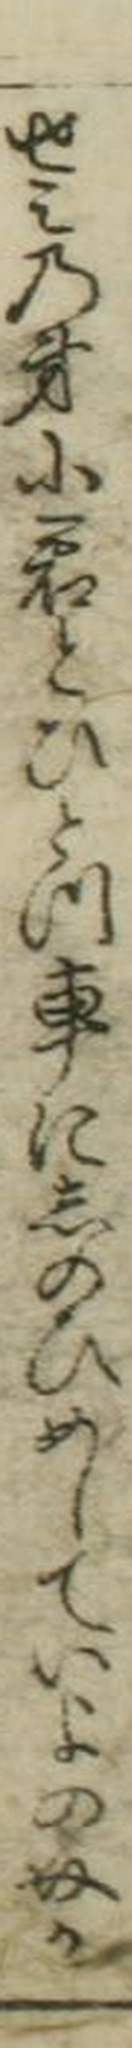せみの弟小君とひとつ車にしのひめしていよの介か
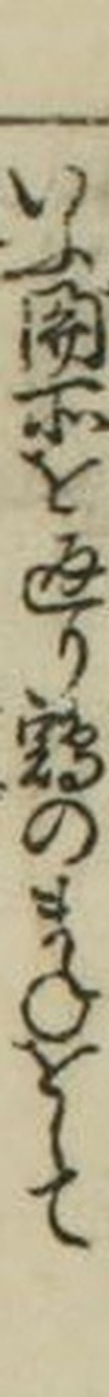いふ関所を通り鶏のまねをして
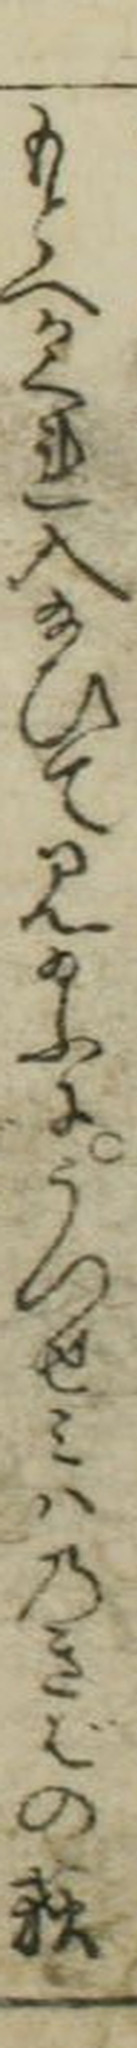もとへかくれ入給ひて見給ふに。うつせみはのきばの荻
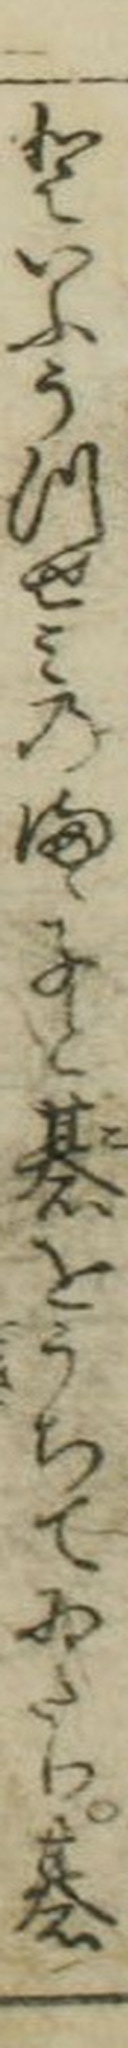といふうつせみのまゝ子と碁をうちてゐたり。碁
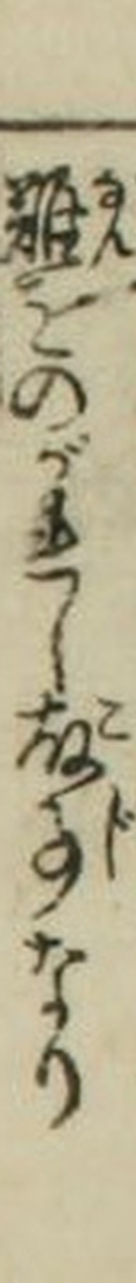難をのがれし故事なり
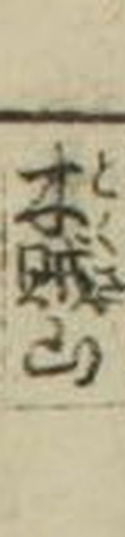木賊山
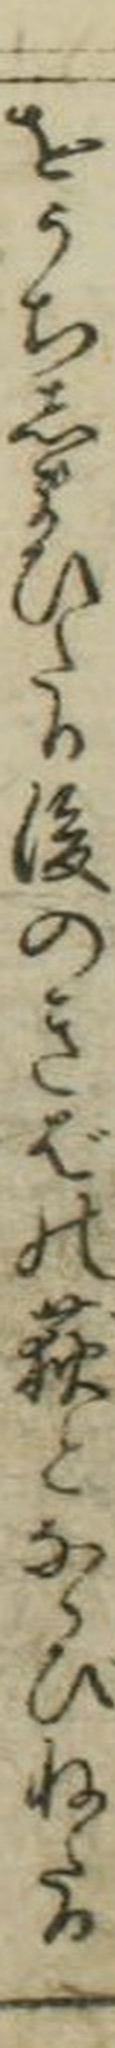をうちしまひたる後のきばの荻とならびねたる
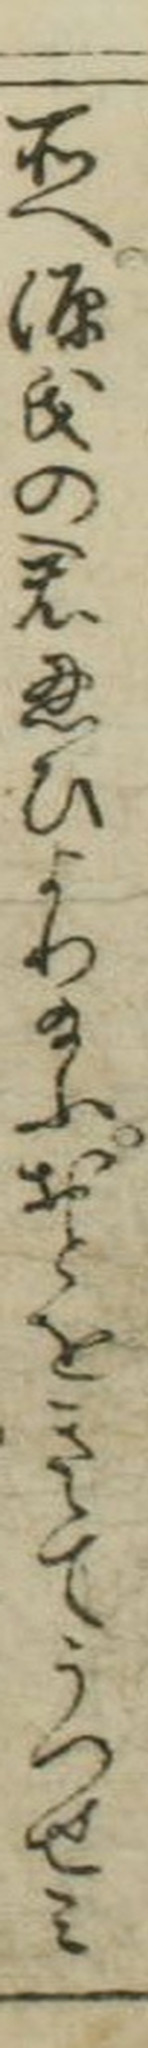所へ。源氏の君忍ひより給ふ。おとをきゝてうつせみ
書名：女源氏教訓鑑
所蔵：東京学芸大学附属図書館
